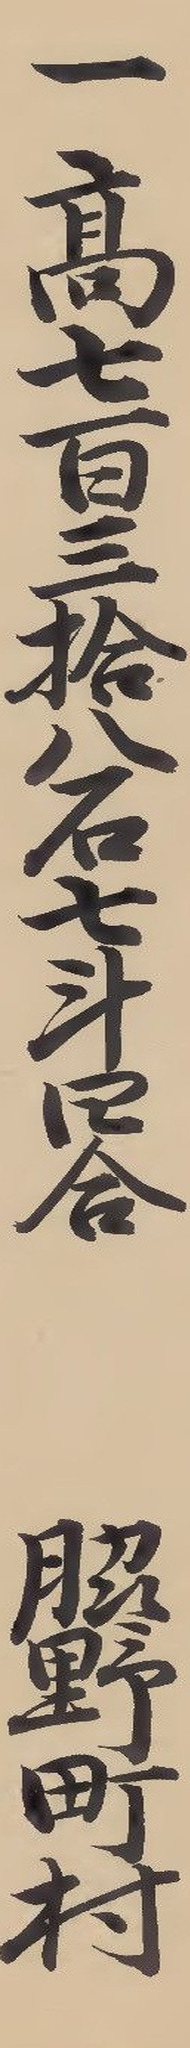一高七百三拾八石七斗四合脇野町村
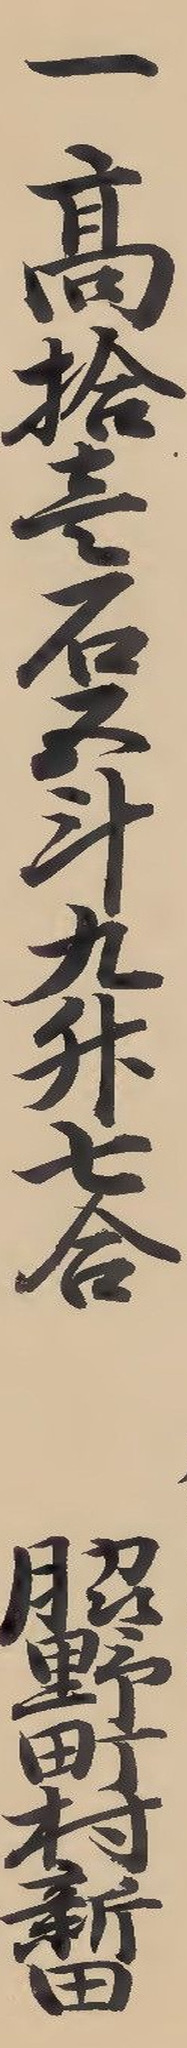一高拾壱石五斗九升七合脇野町村新田
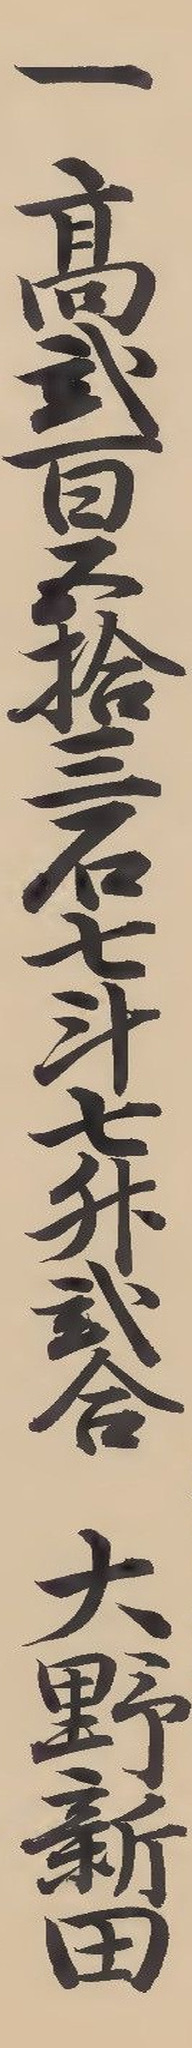一高弐百五拾三石七斗七升弐合大野新田
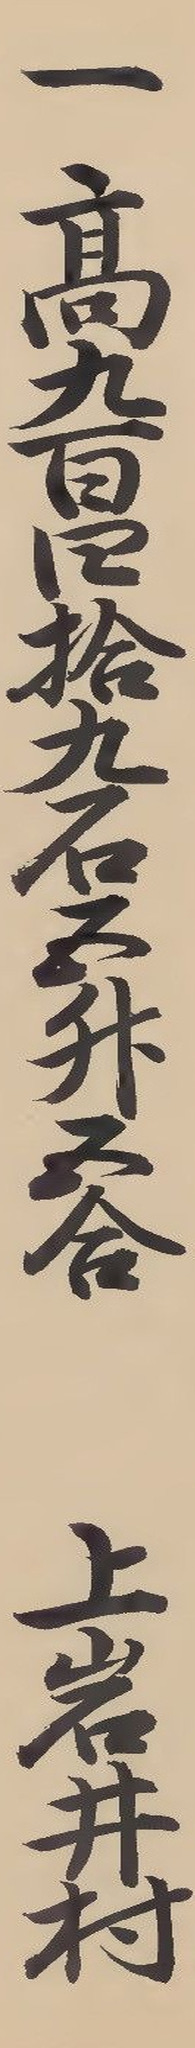一高九百四拾九石五升五合上岩井村
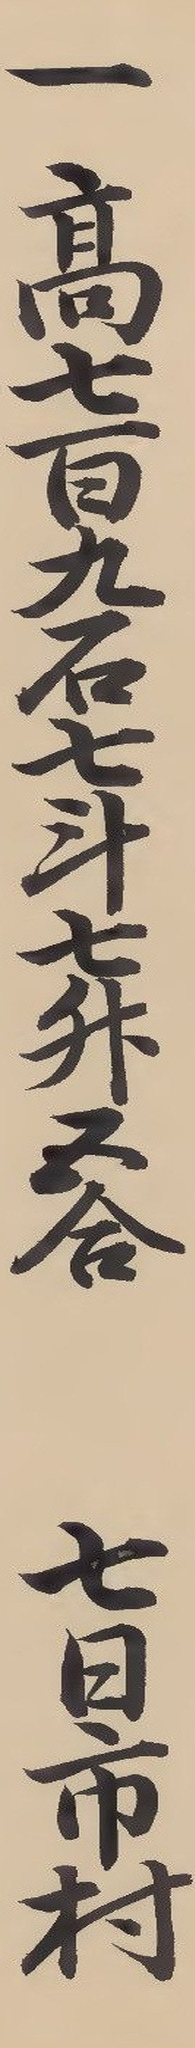一高七百九石七斗七升五合七日市村
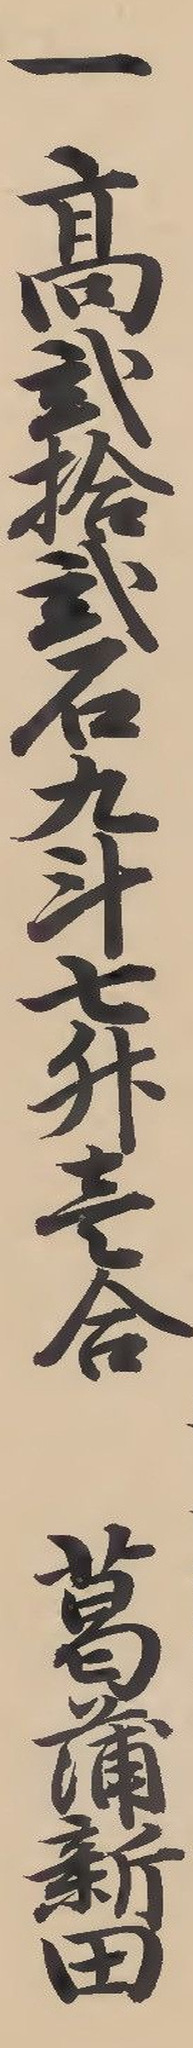一高弐拾弐石九斗七升壱合葛蒲新田

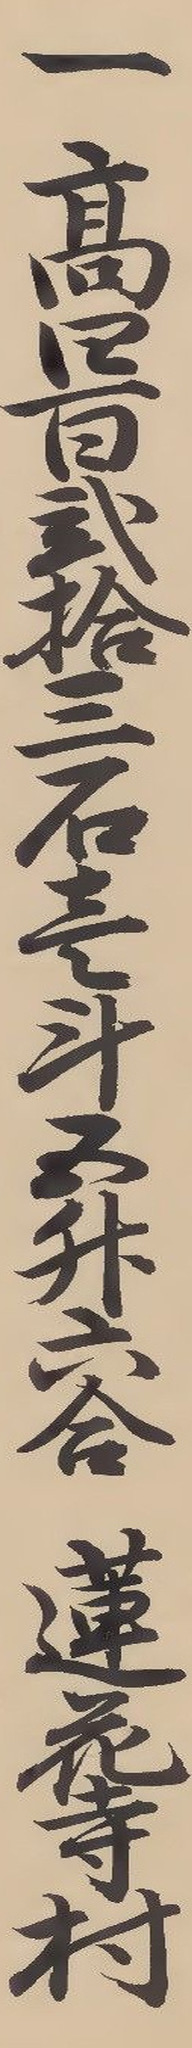一高四百弐拾三石壱斗五升六合蓮花寺村
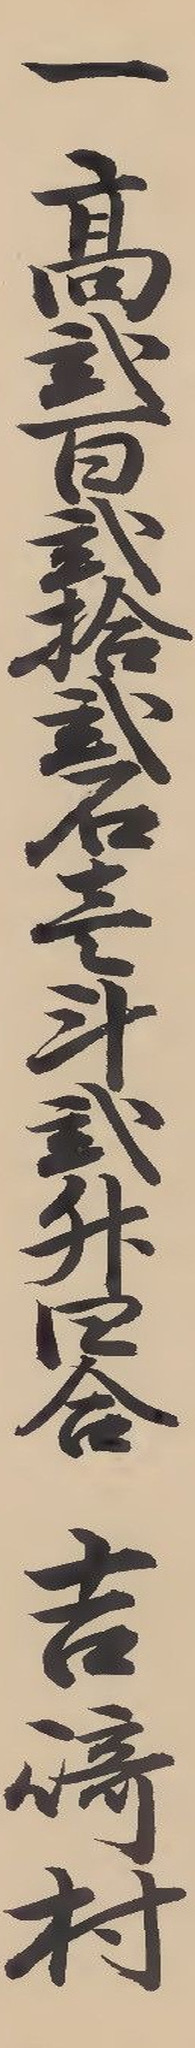一高弐百弐拾弐石壱斗弐升四合吉崎村
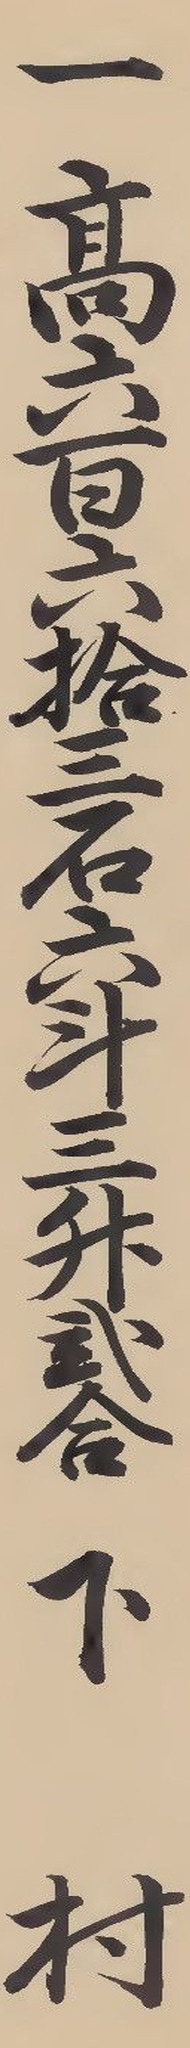一高六百六拾三石六斗三升弐合下村
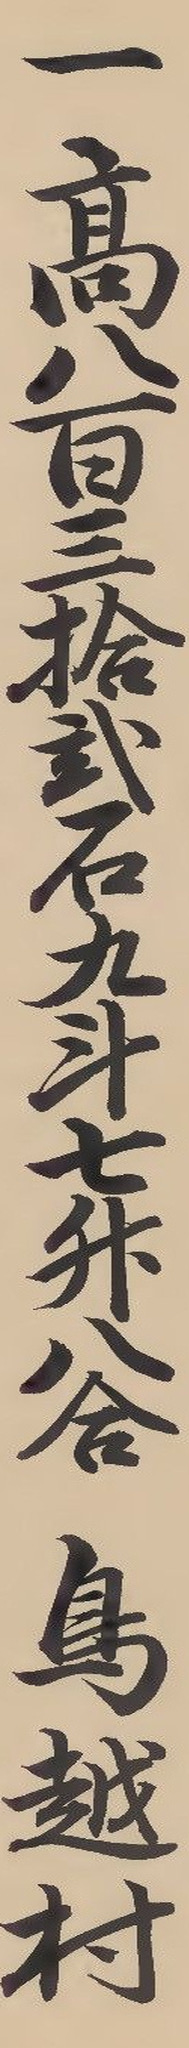一高八百三拾弐石九斗七升八合鳥越村
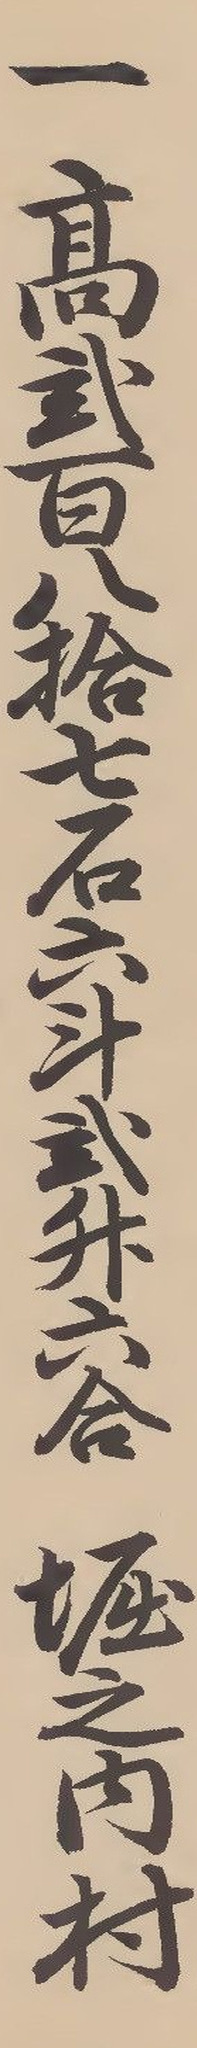一高弐百八拾七石六斗弐升六合堀之内村
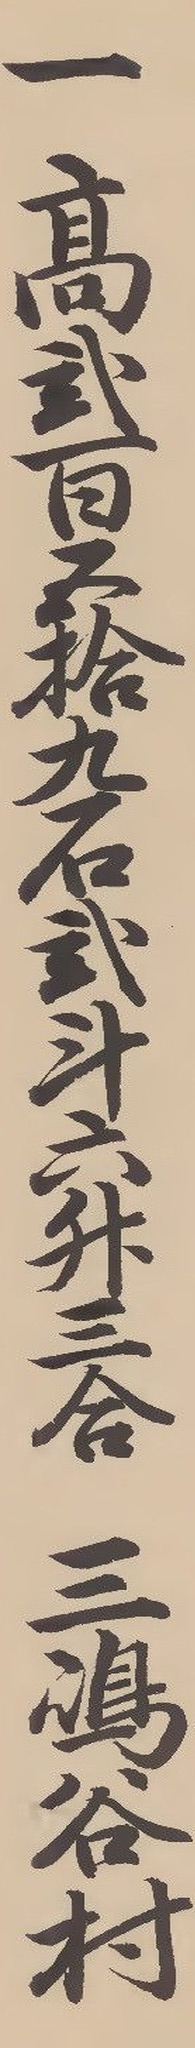一高弐百五拾九石弐斗六升三合三島谷村
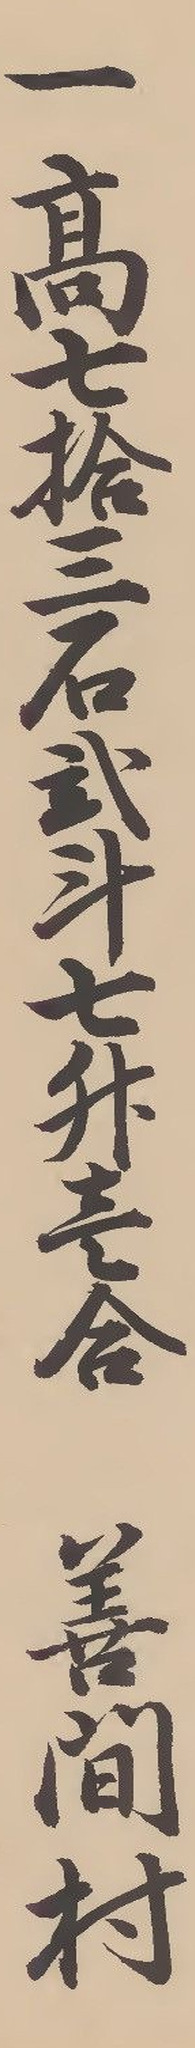一高七拾三石弐斗七升壱合善間村

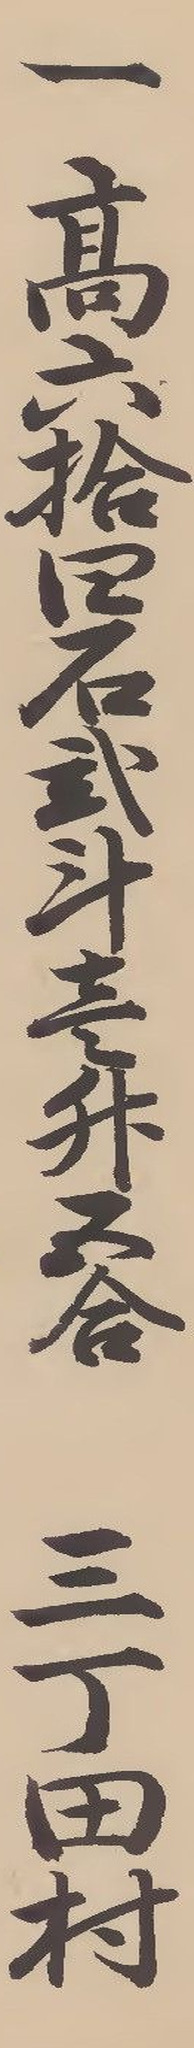一高六拾四石弐斗壱升五合三丁田村
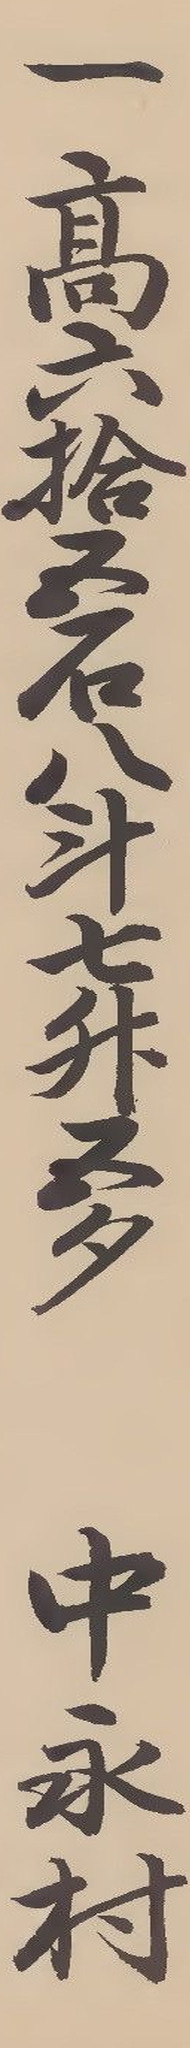一高六拾五石八斗七升五勺中永村
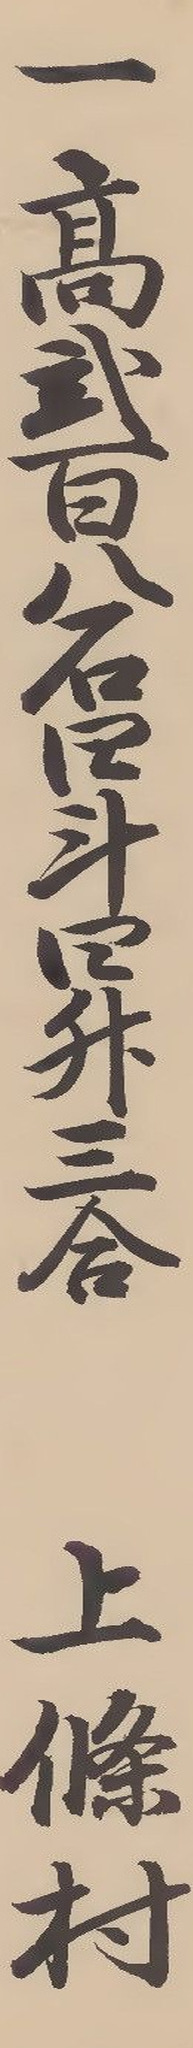一高弐百八石四斗四升三合上条村
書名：越後国郷帳　中
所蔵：国立公文書館 National Archives of Japan
